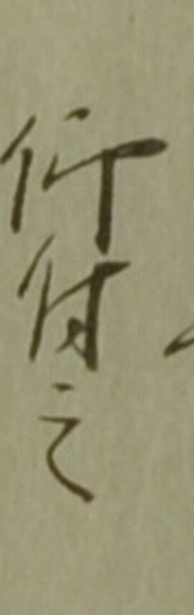仰付之
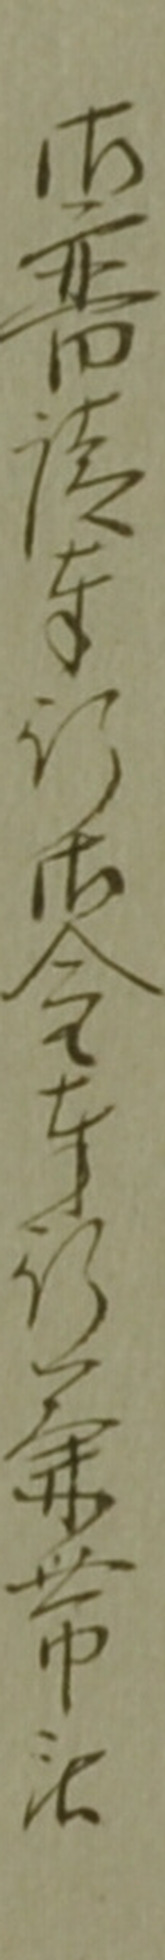御普請奉行御金奉行兼帯被
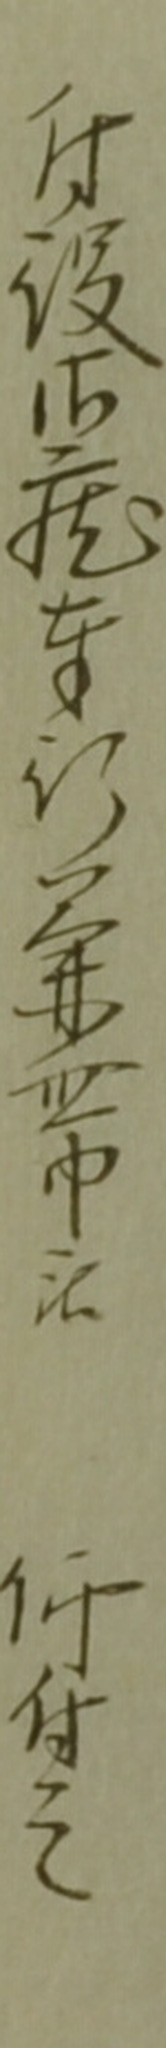付役御蔵奉行兼帯被仰付之
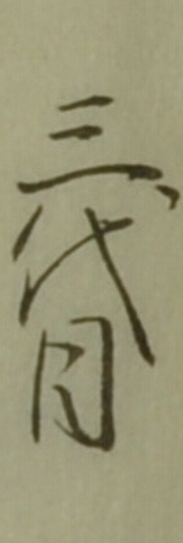三代目
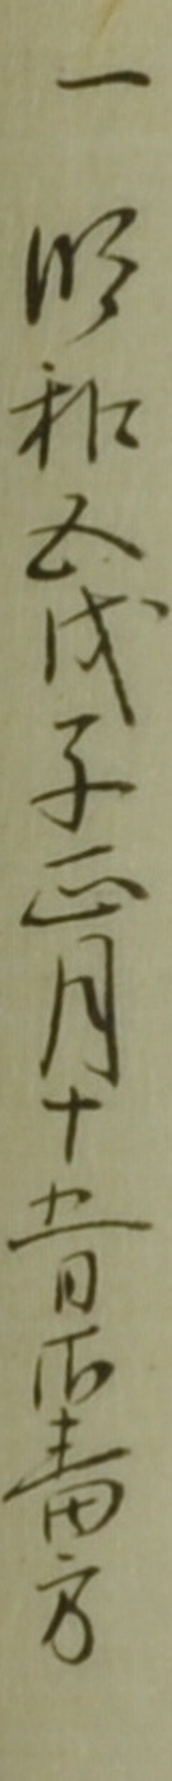一明和五戊子正月十五日御番方
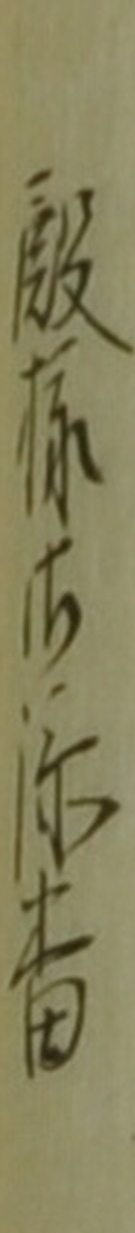殿様御添番
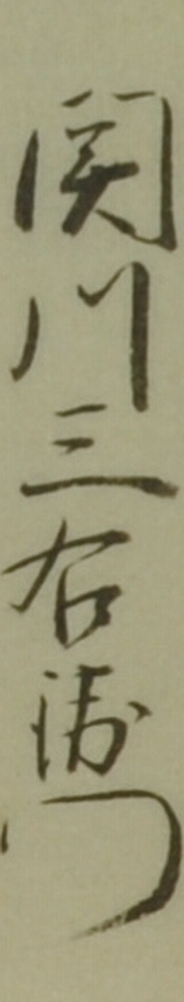関川三右衛門
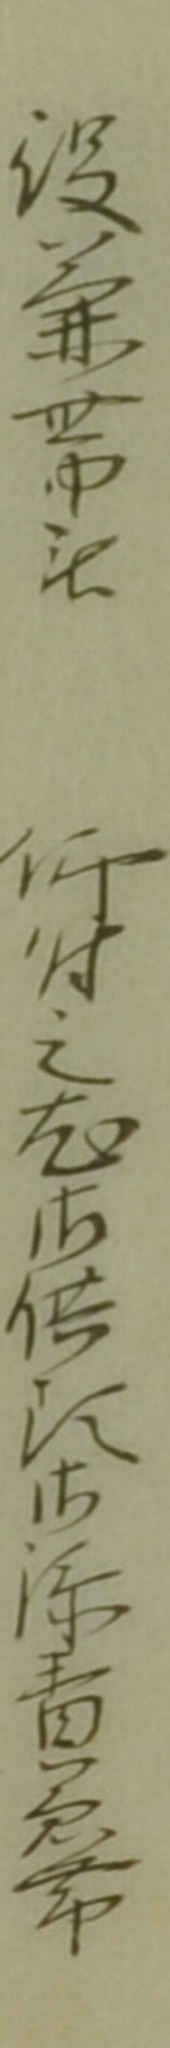役兼帯被仰付之尤御借頭御添番兼帯
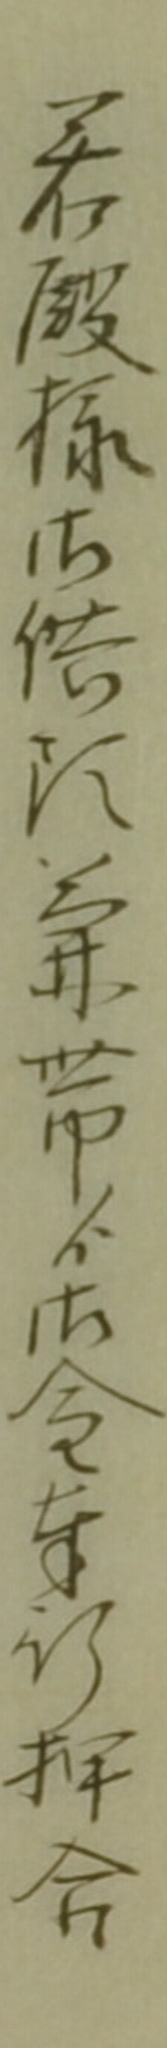若殿様御借頭兼帯ゟ御金奉行押合
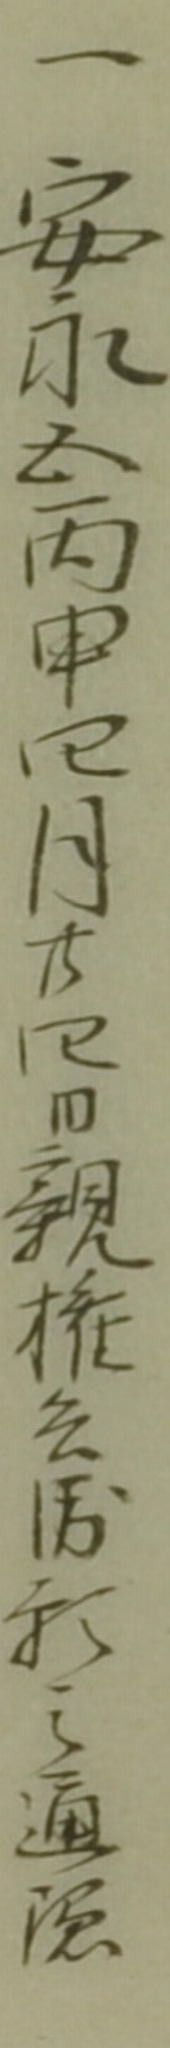一安永五丙申四月廿四日親権兵衛願之通隠
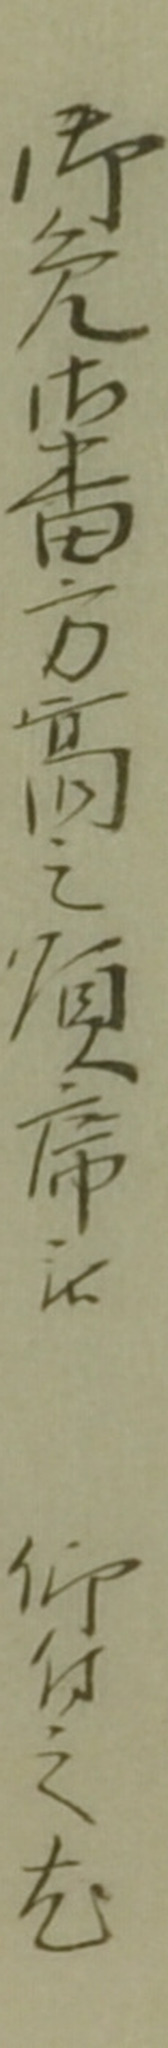御免御番方高之順席被仰付之尤
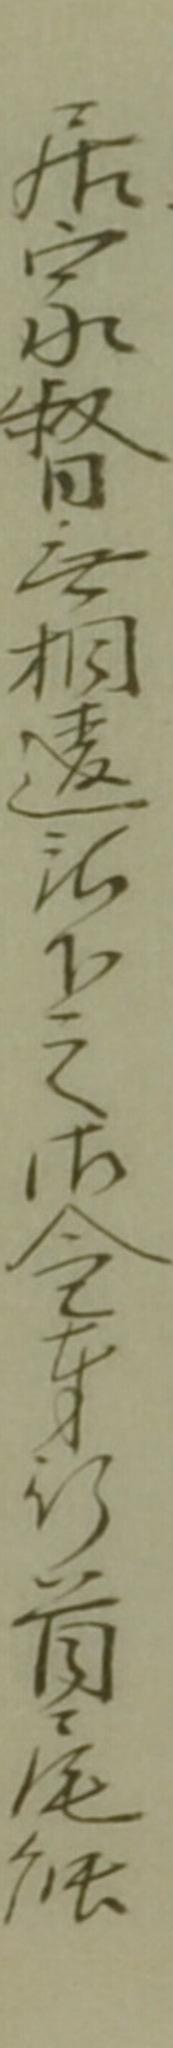居家督無相違被下之御金奉行首尾能
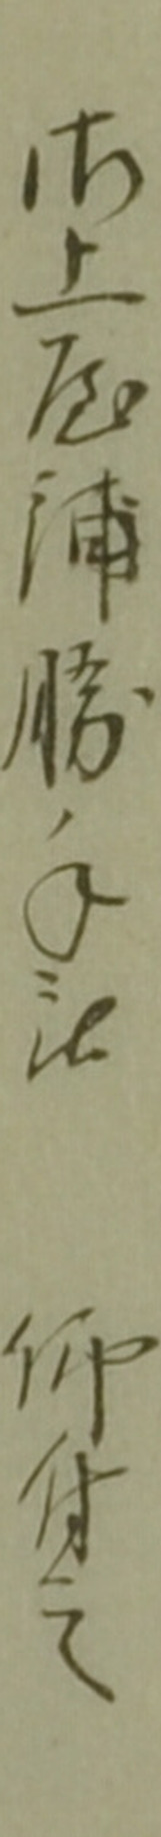御上屋敷勝手被仰付之
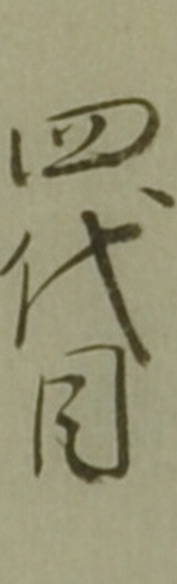四代目
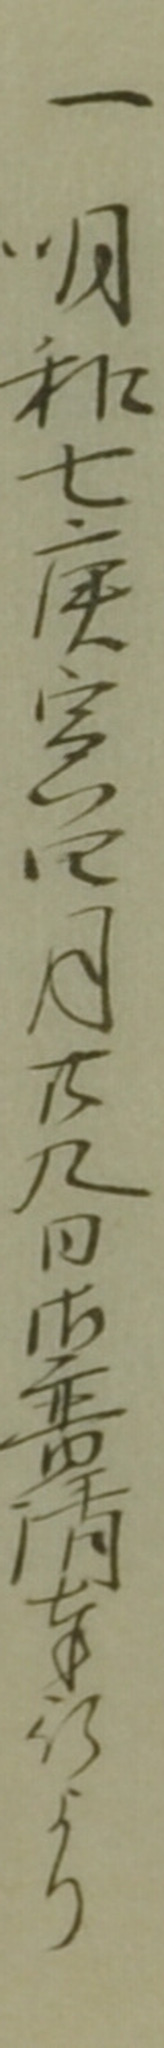一明和七庚寅四月廿九日御普請奉行より
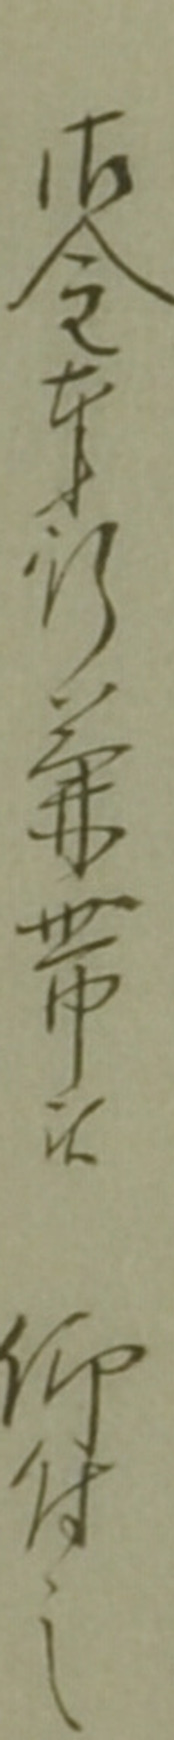御金奉行兼帯被仰付之
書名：諸御役代々録（七）
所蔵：伊那市立高遠町図書館・合同会社AMANE
